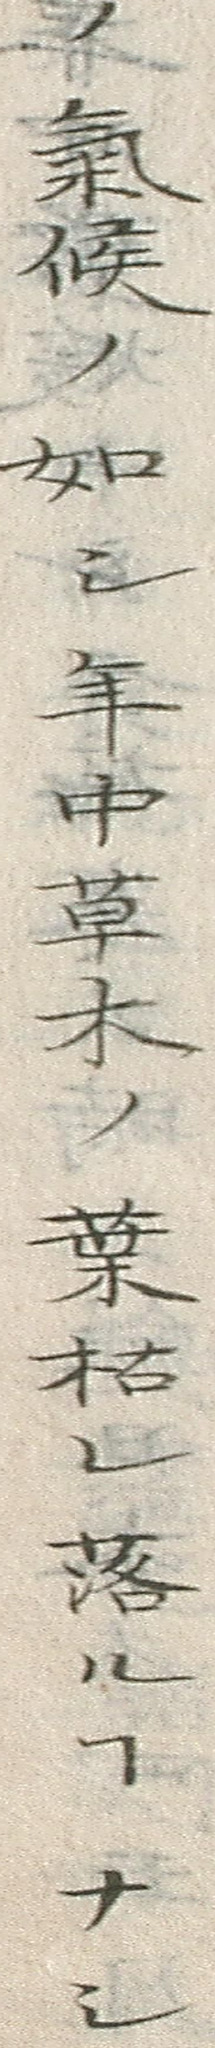ノ気候ノ如シ年中草木ノ葉枯ルコトナシ
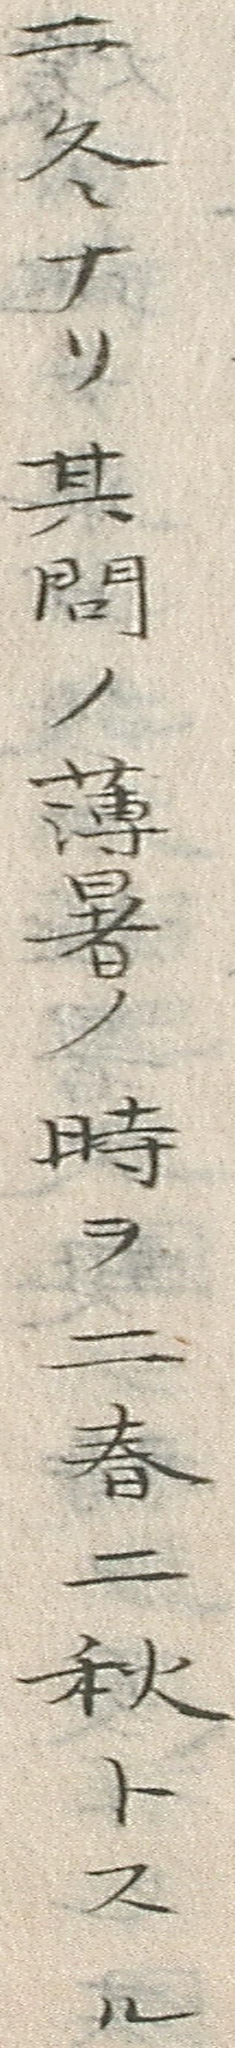二冬ナリ其間ノ薄暑ノ時ヲ二春二秋トスル
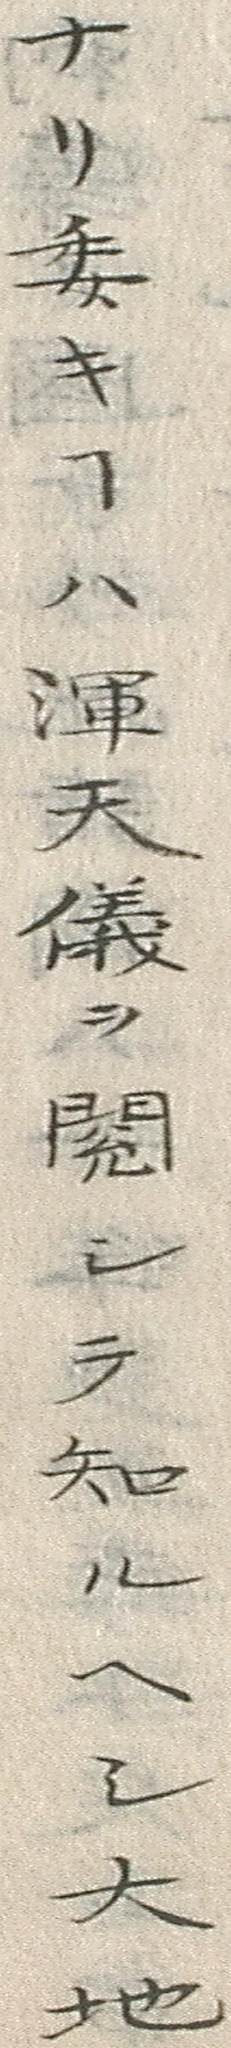ナリ委キコトハ渾天儀ヲ閲シテ知ルヘシ大地
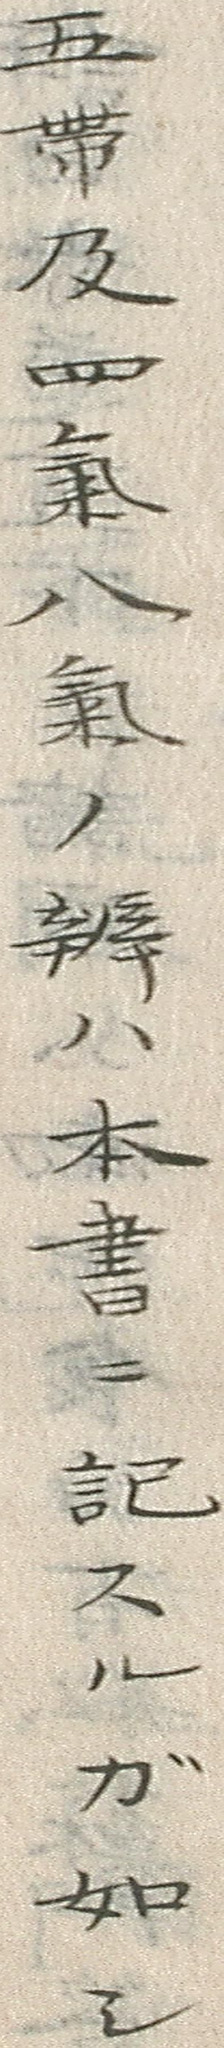五帯及四気八気ノ弁ハ本書ニ記スルガ如シ
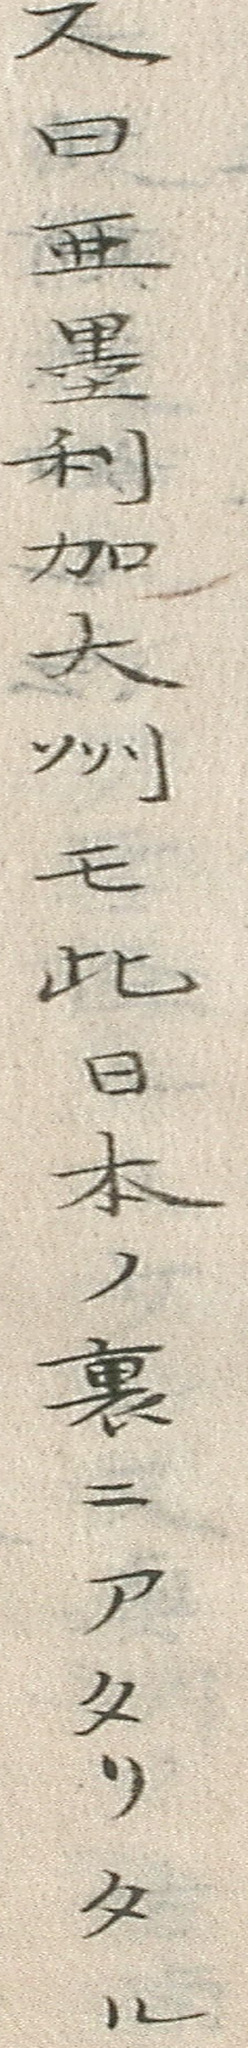又曰亜墨利加大州モ此日本ノ裏ニアタリタル
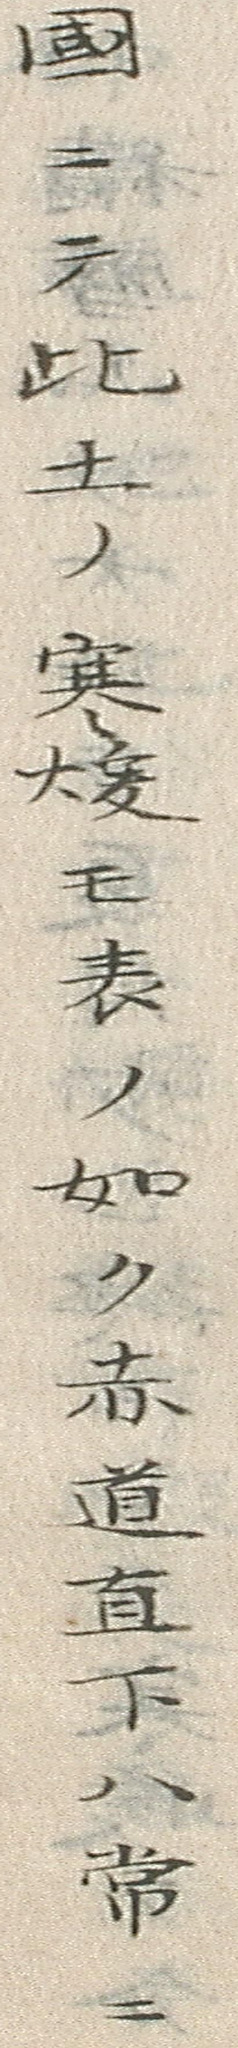国ニテ此土ハ寒煖モ表ノ如ク赤道直下ハ常ニ
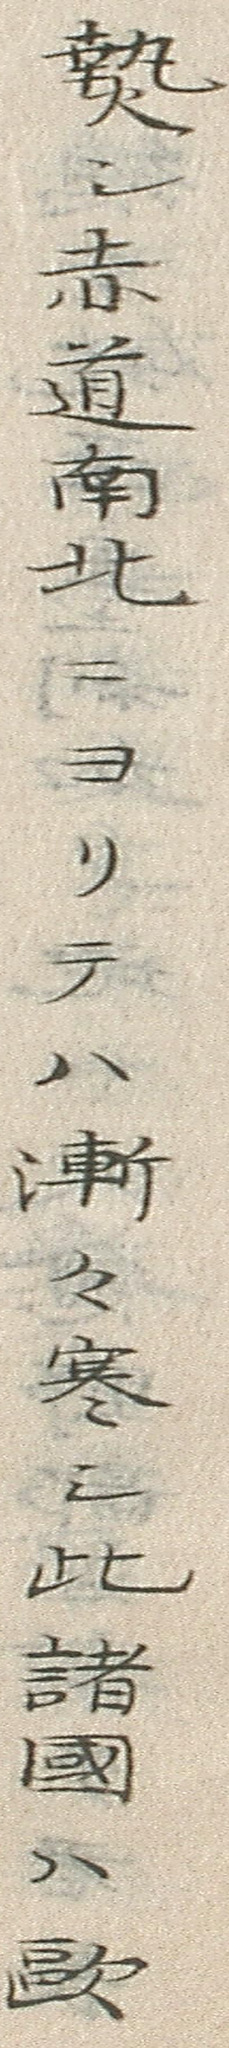熱シ赤道南北ニヨリテハ漸々寒シ此諸国ハ欧
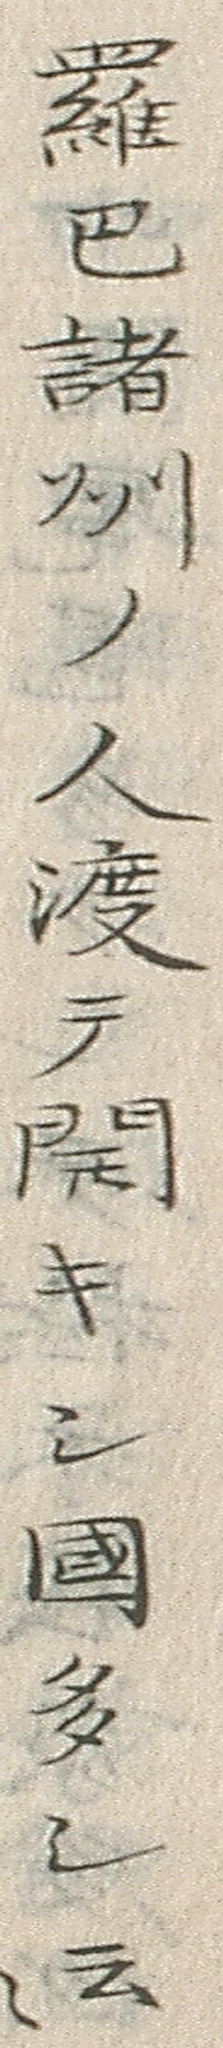羅巴諸州ノ人渡テ開キシ国多シ云〻
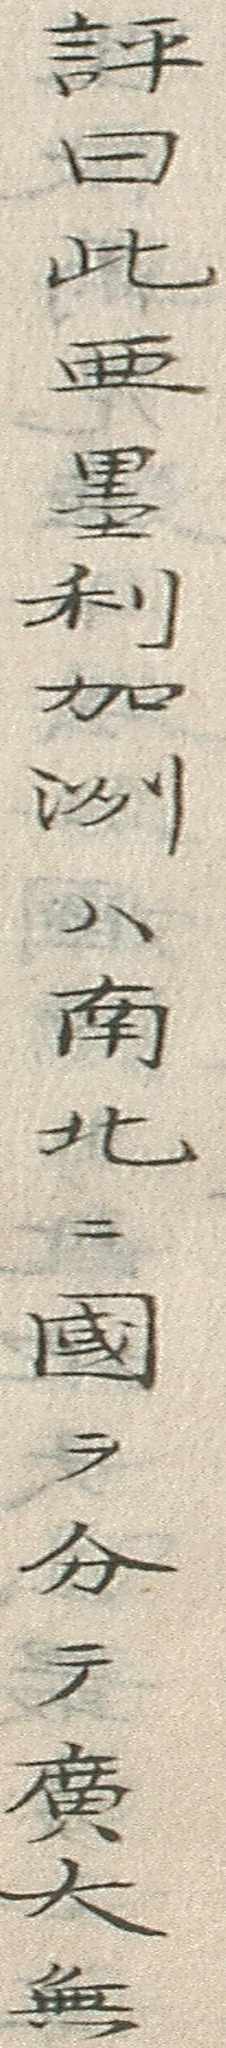評曰此亜墨利加洲ハ南北ニ国ヲ分テ広大無
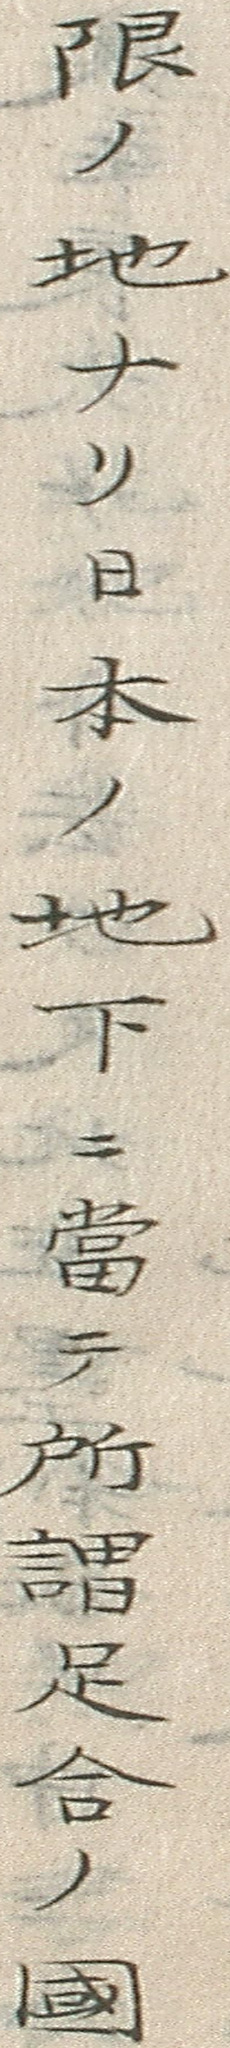限ノ地ナリ日本ノ地下ニ当テ所謂足合ノ国
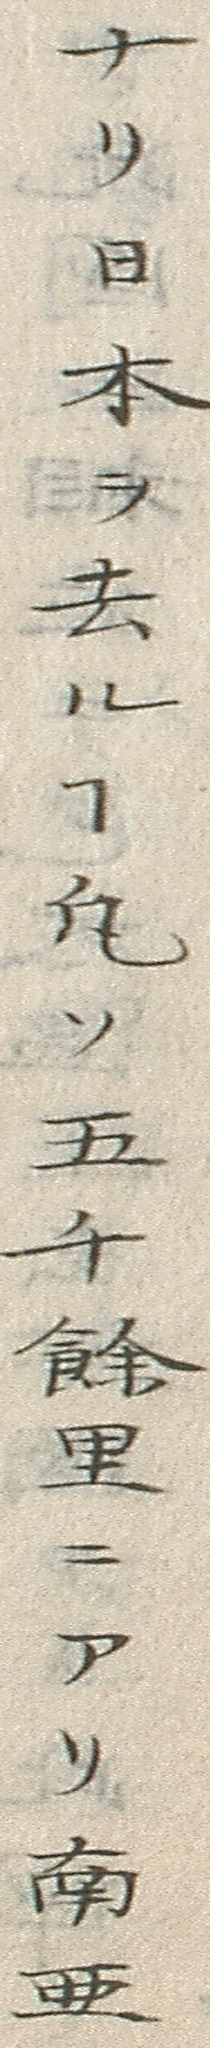ナリ日本ヲ去ルコト凡ソ五十余里ニアリ南亜
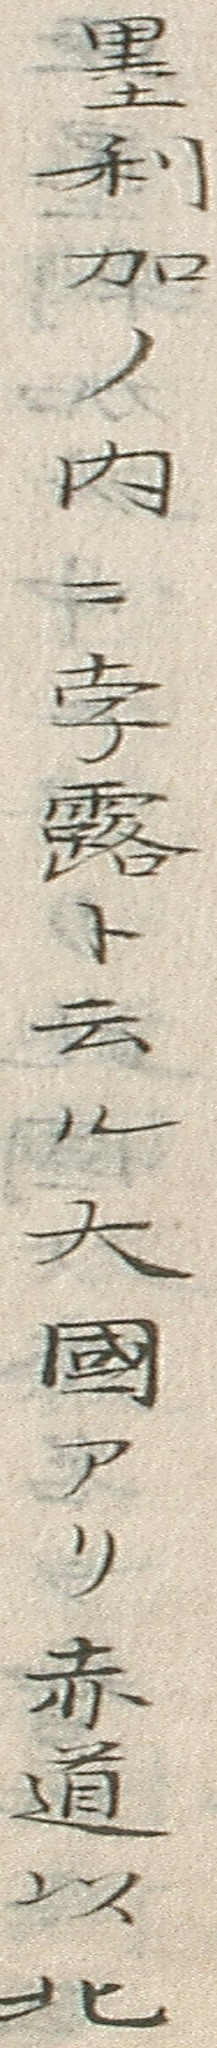墨利加ノ内ニ孛露ト云ル大国アリ赤道以北
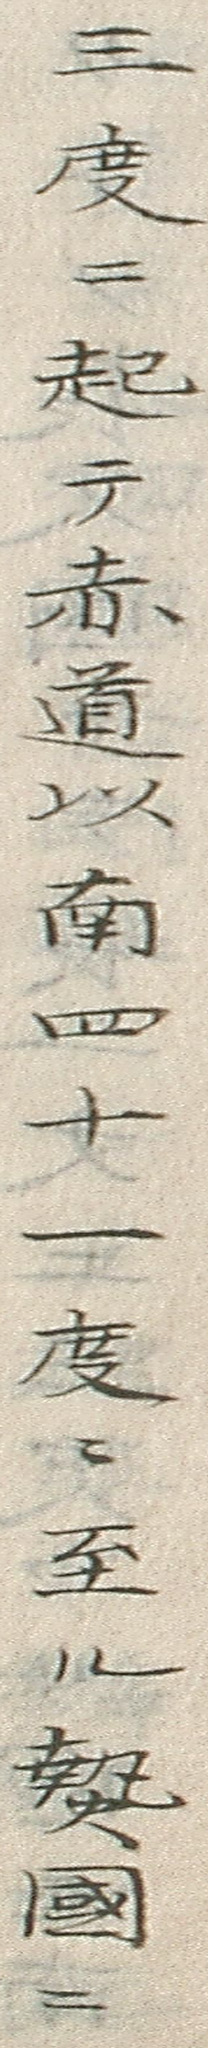三度ニ起テ赤道以南四十一度ニ至ル熱国ニ
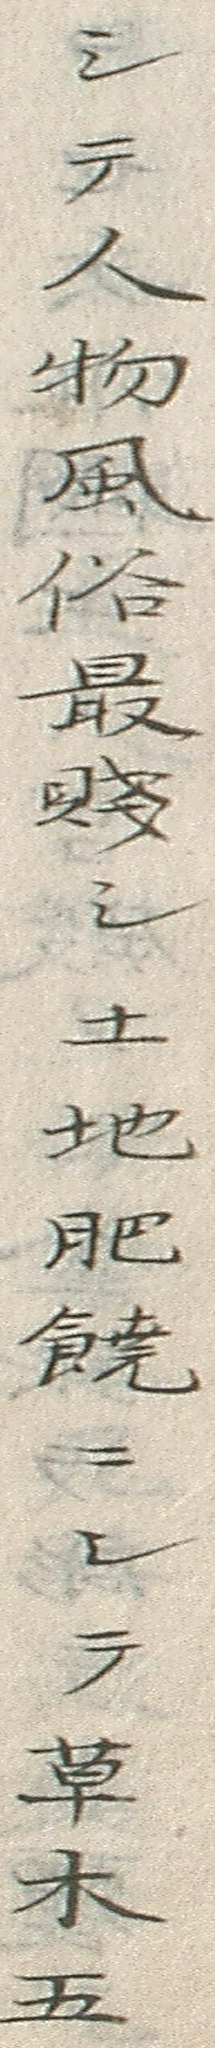シテ人物風俗最賎シキ地肥饒ニシテ草木五
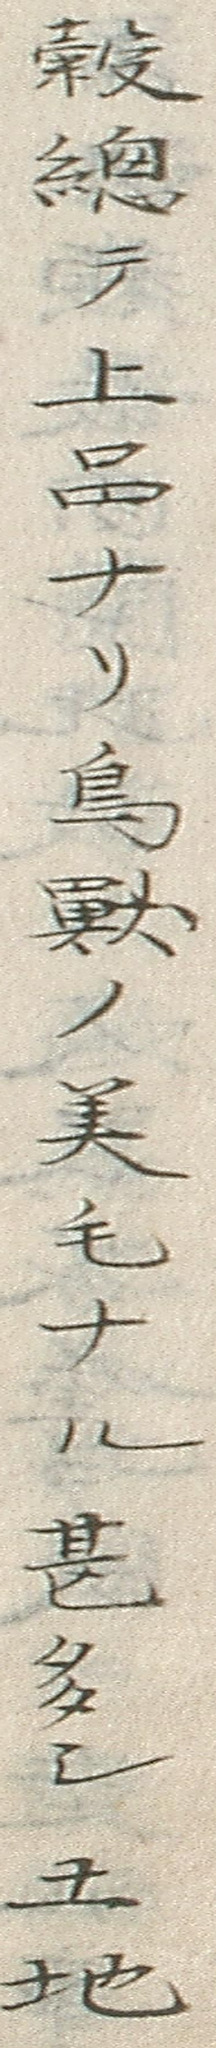穀総テ上品ナリ鳥獣ノ美毛ナル甚多シ土地
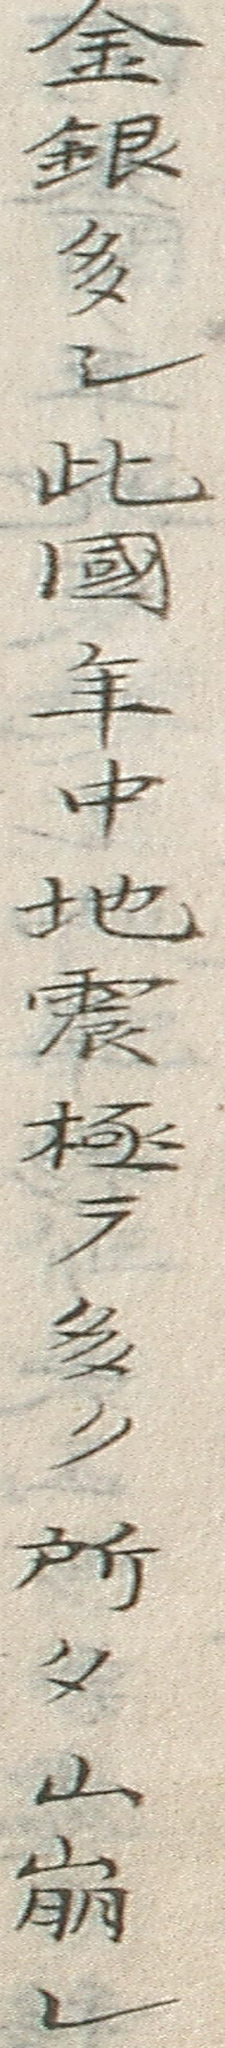金銀多シ此国年中地震極テ多ク所タ山崩レ
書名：天學略名目羽翼　全
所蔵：東京大学地震研究所図書室 Earthquake Research Institute Library, The University of Tokyo, JAPAN
